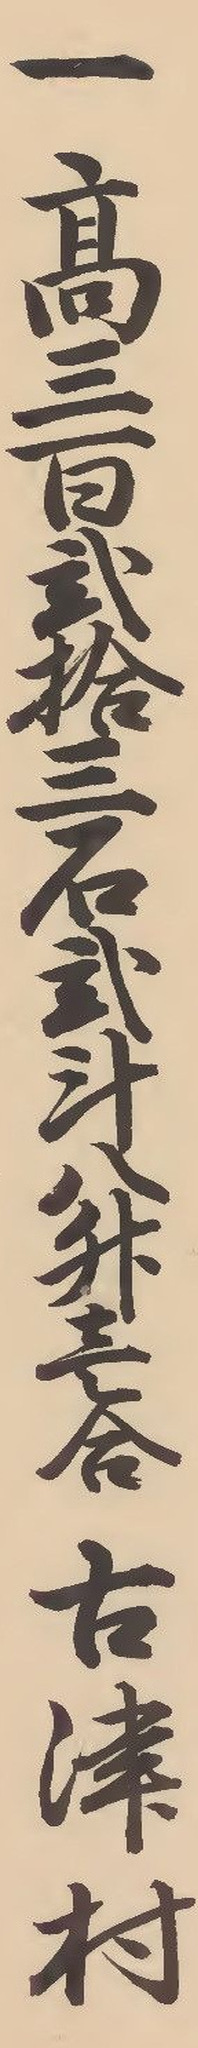一高三百弐拾三石弐斗八升壱合古津村

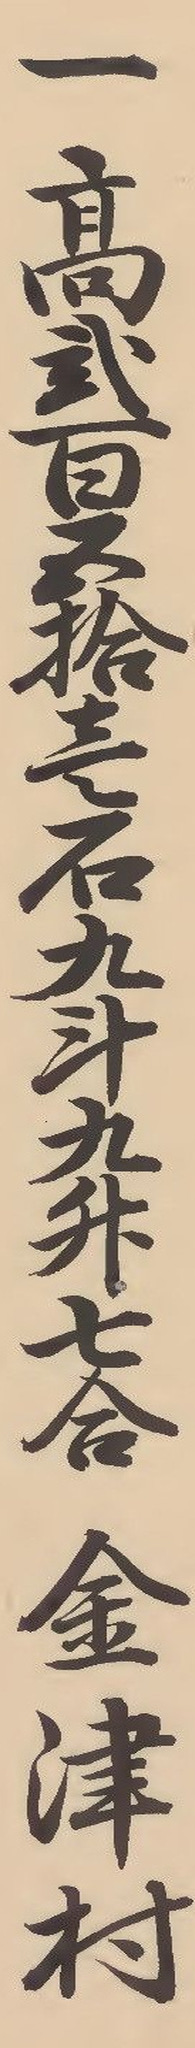一高弐百五拾壱石九斗九升七合金津村
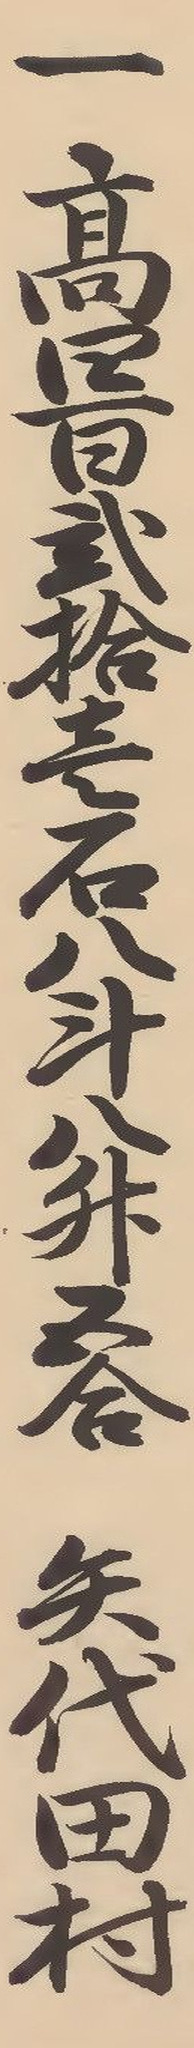一高四百弐拾壱石八斗八升五合矢代田村
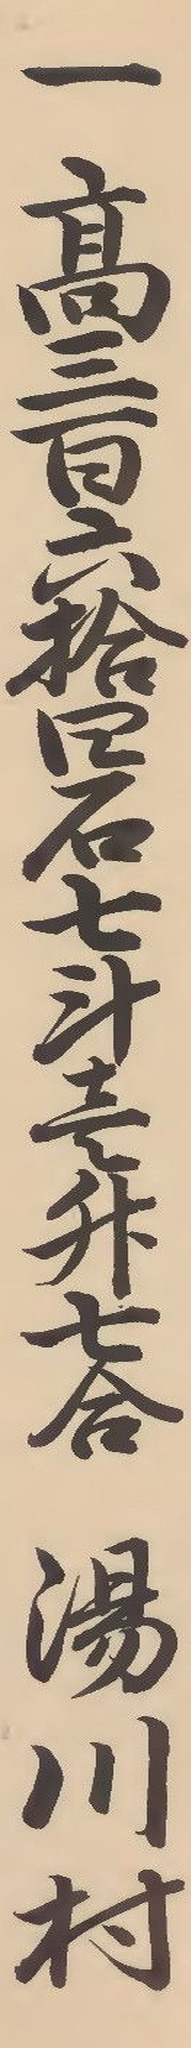一高三百六拾四石七斗壱升七合湯川村
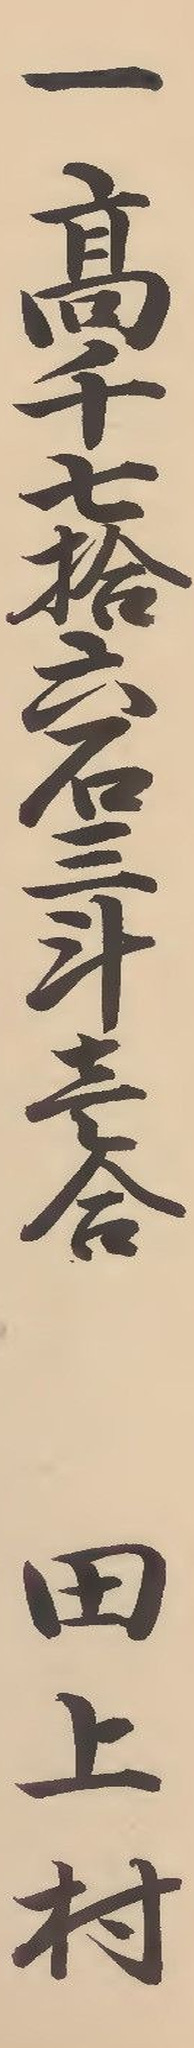一高千七拾六石三斗壱合田上村
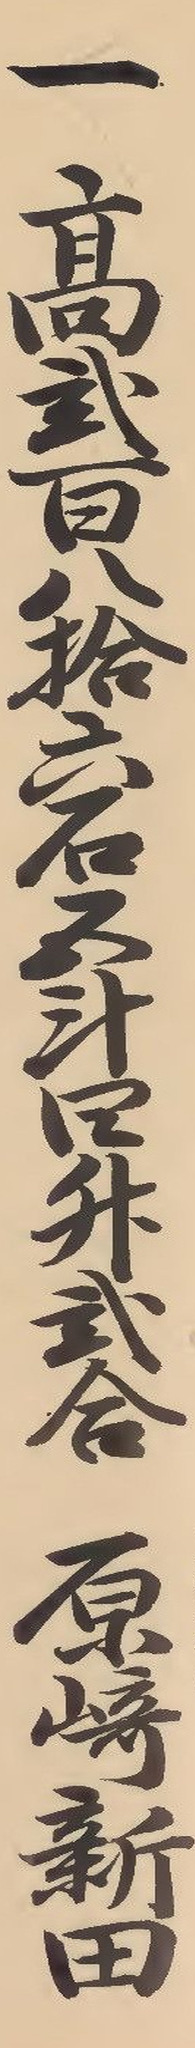一高弐百八拾六石五斗四升弐合原崎新田
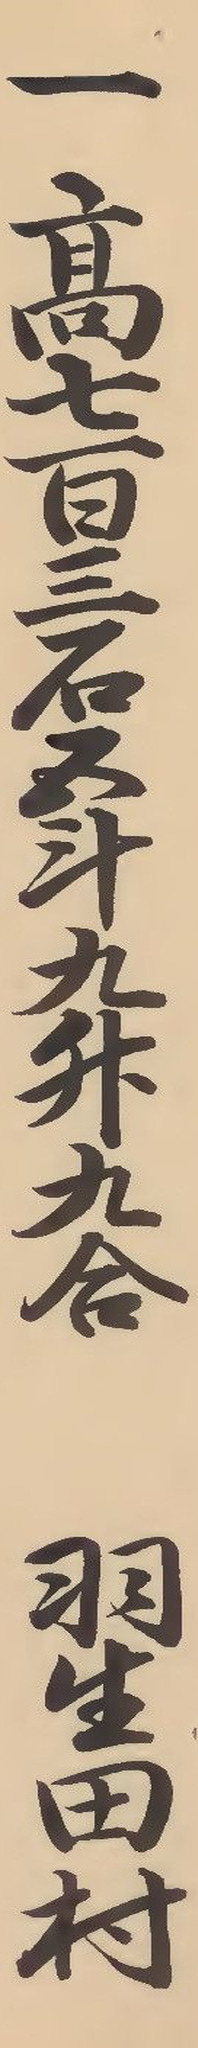一高七百三石五斗九升九合羽生田村
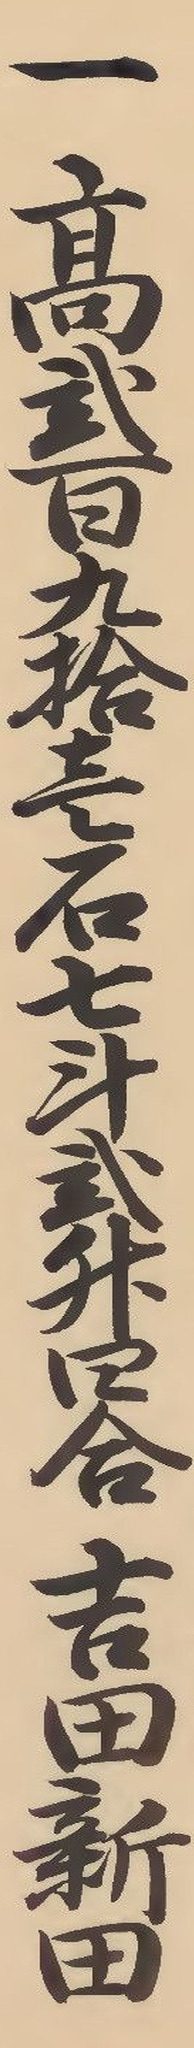一高弐百九拾壱石七斗弐升四合吉田新田
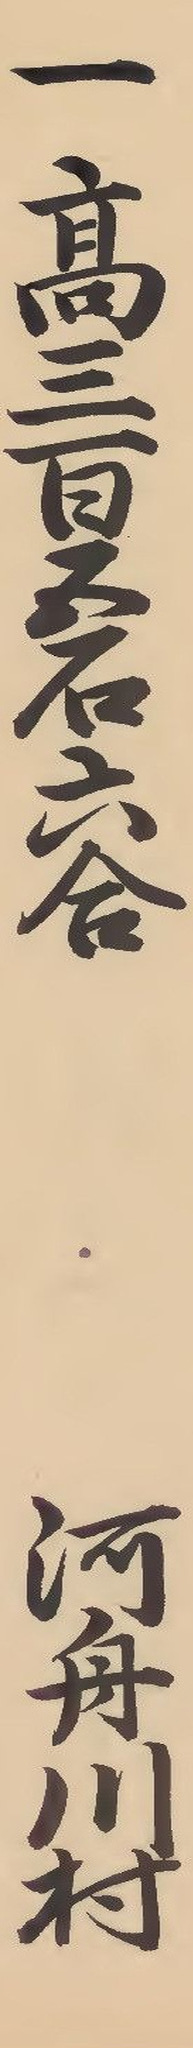一高三百五石六合河舟川村

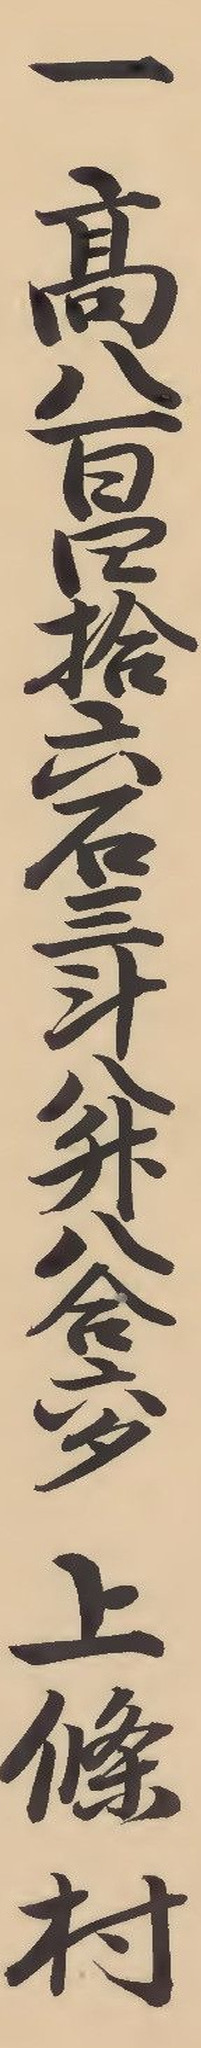一高八百四拾六石三斗八升八合六勺上条村
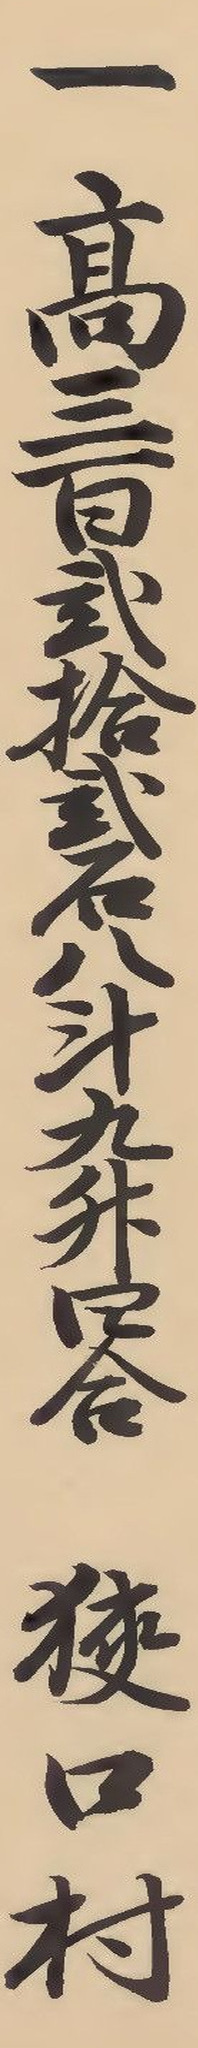一高三百弐拾弐石八斗九升四合狭口村
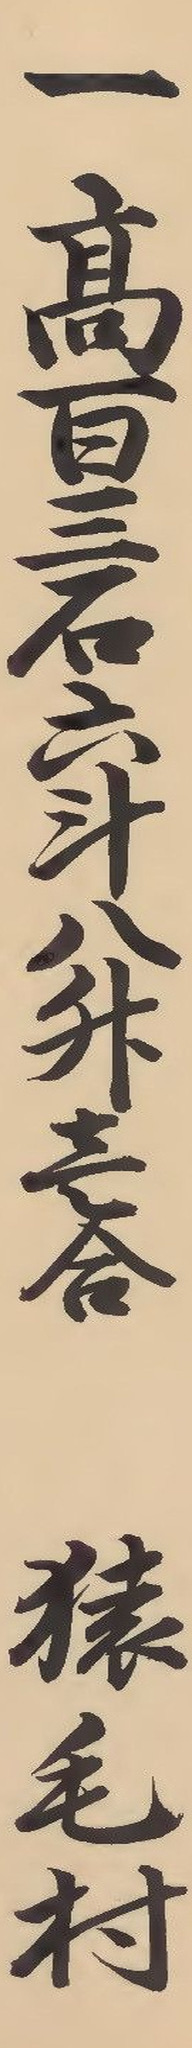一高百三石六斗八升壱合猿毛村
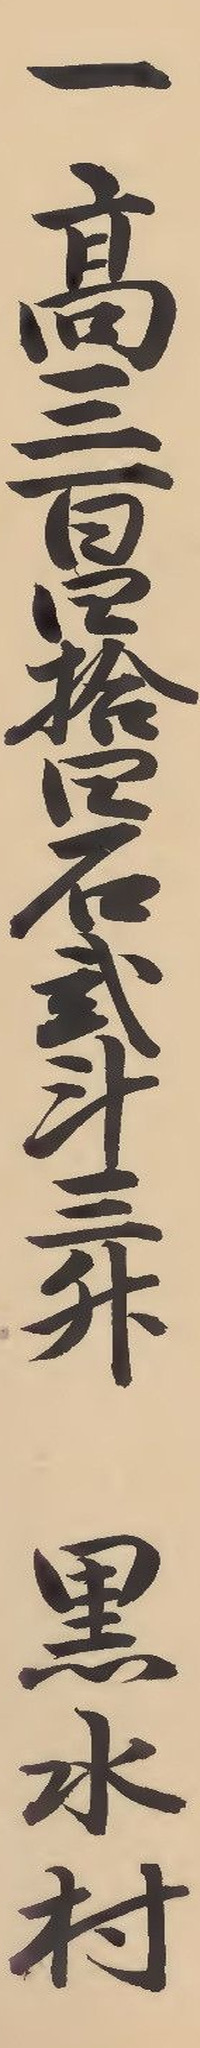一高三百四拾四石弐斗三升黒水村
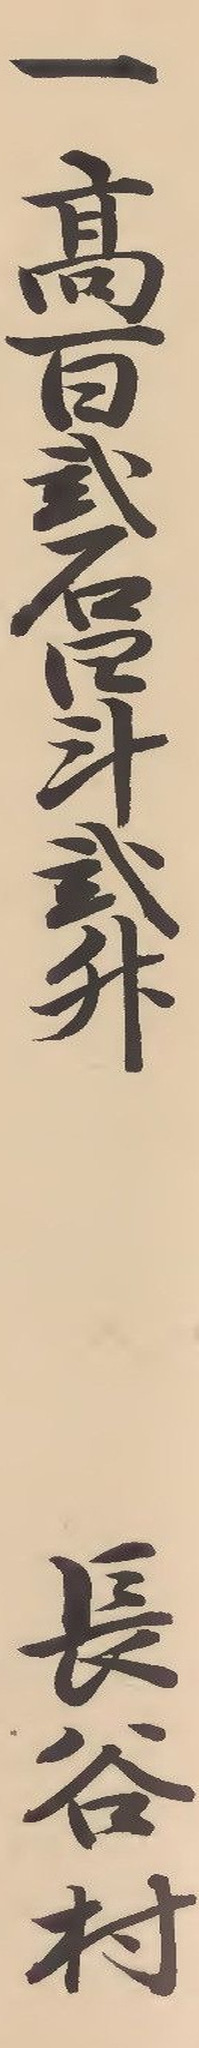一高百弐石四斗弐升長谷村
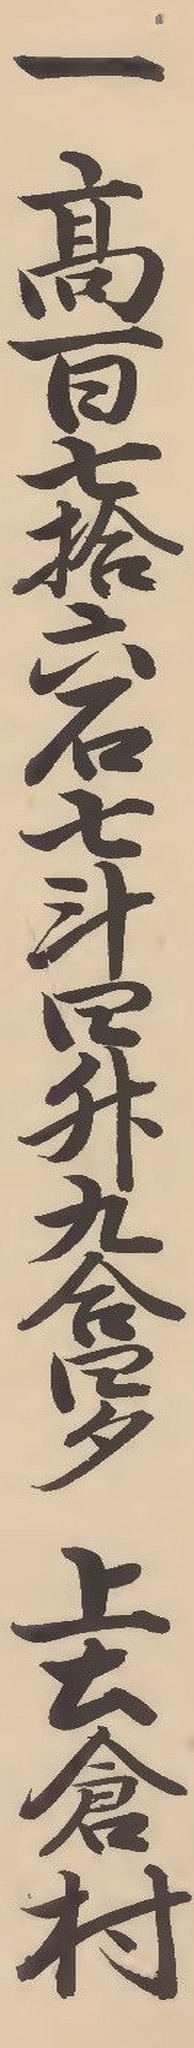一高百七拾六石七斗四升九合四勺上土倉村
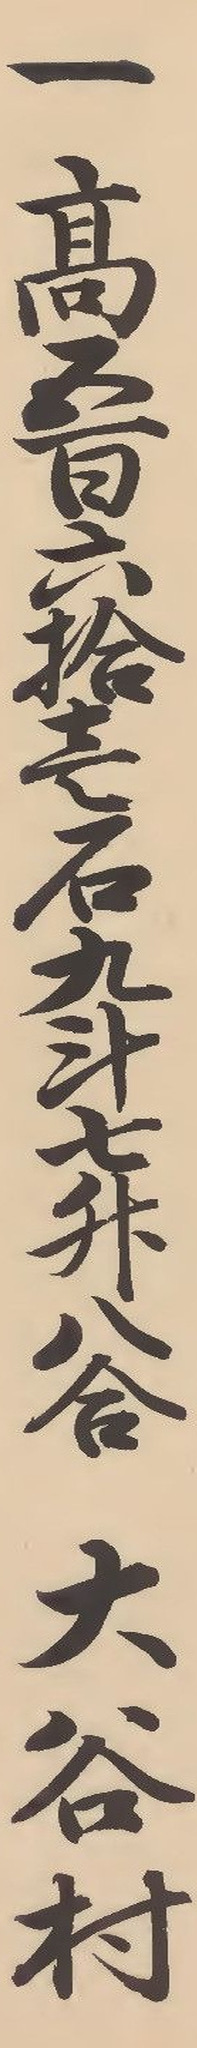一高五百六拾壱石九斗七升八合大谷村
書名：越後国郷帳　下
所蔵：国立公文書館 National Archives of Japan
